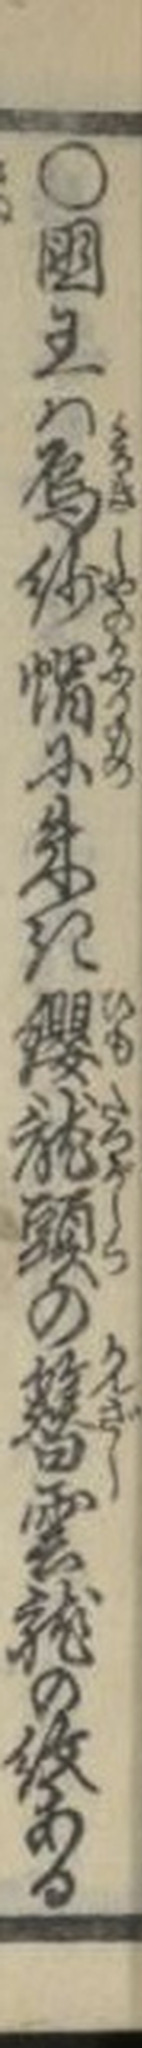○国王は烏紗帽に朱き纓龍頭の簪雲龍の紋ある
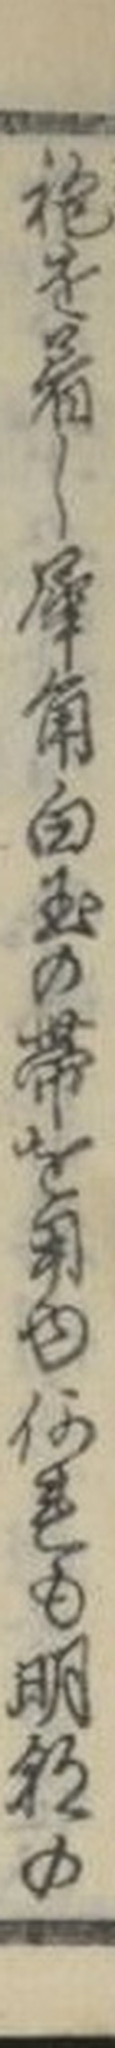袍を着し犀角白玉の帯を用ゆ何れも明朝の
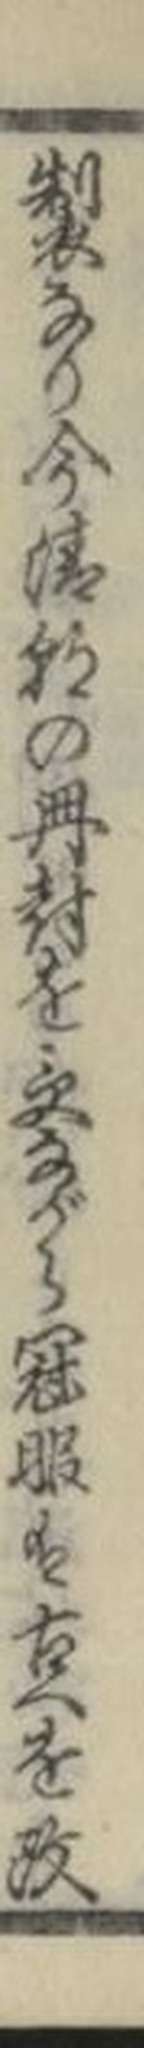製なり今清朝の冊封を受ながら冠服は古へを改
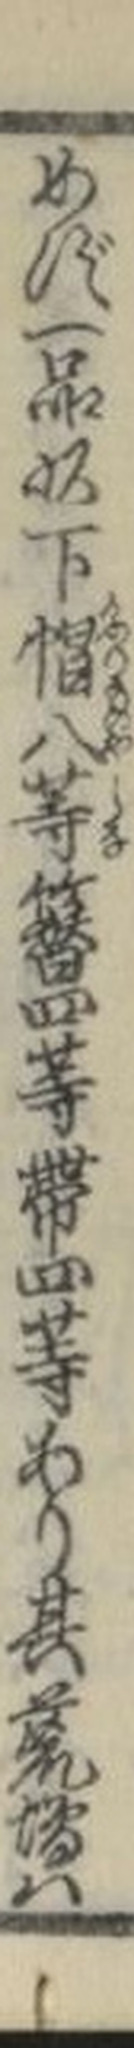めず一品以下帽八等簪四等帯四等あり其荒増は
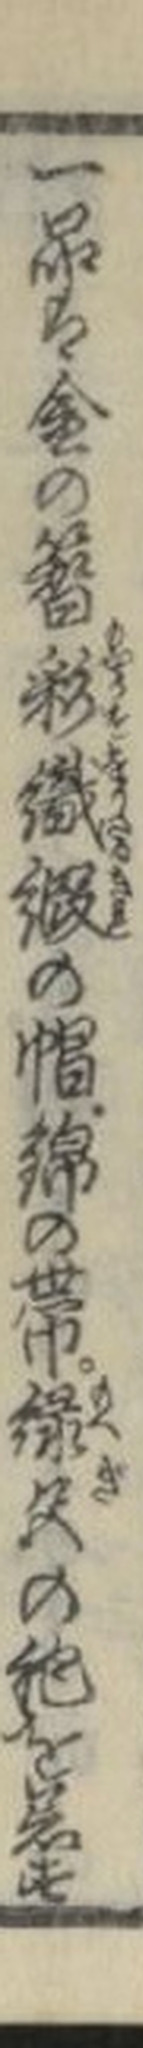一品は金の簪彩織緞の帽。綿の帯。緑色の袍を着す
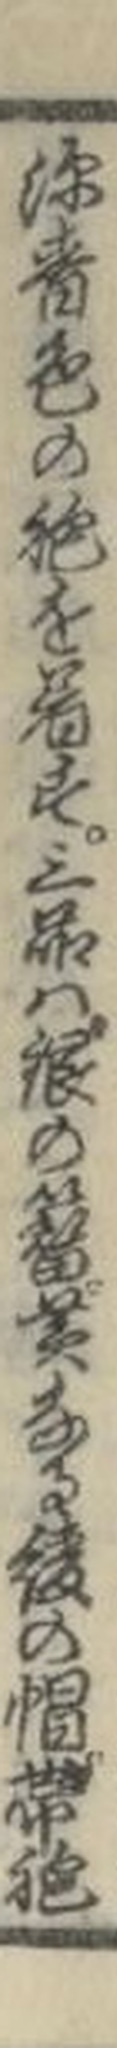深青色の袍を着す。三品は。銀の簪。黄なる綾の帽。帯袍
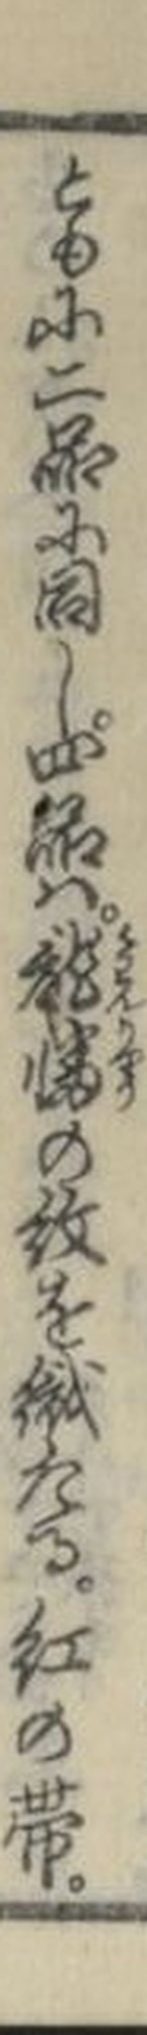ともに二品に同し。四品は。龍蟠の紋を織たる。紅の帯。
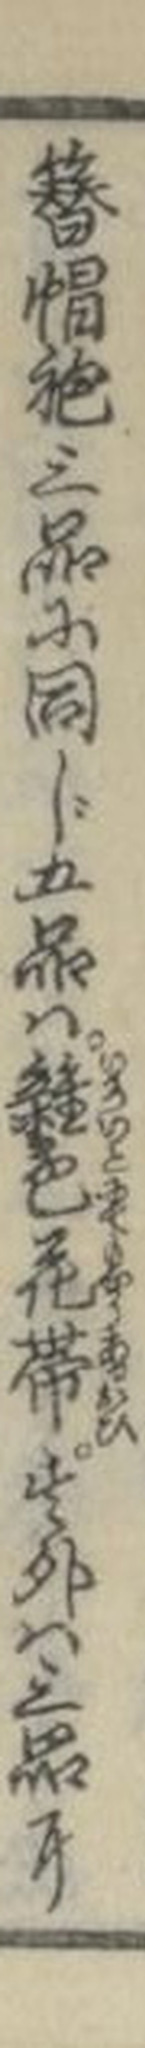簪帽袍三品に同じ五品は。絲色花帯。其外は三品に
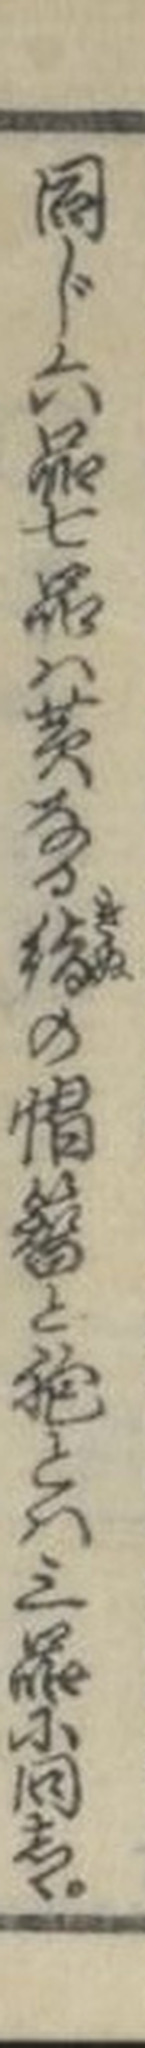同じ六品七品は黄なる絹の帽簪と袍とは三品に同しく。
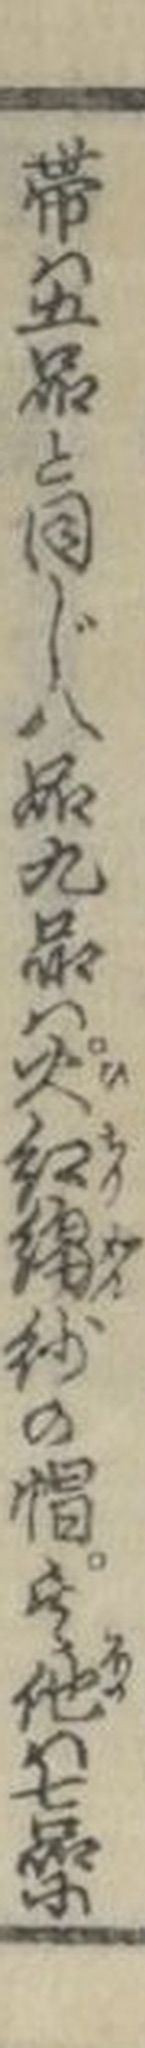帯は五品と同じ八品九品は。火紅綿紗の帽。其他は七品に
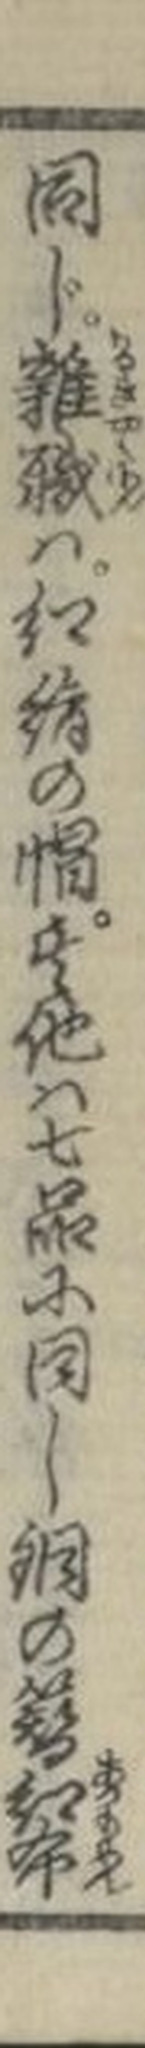同じ。雑職は。紅絹の帽。其他は七品に同し銅の簪紅布
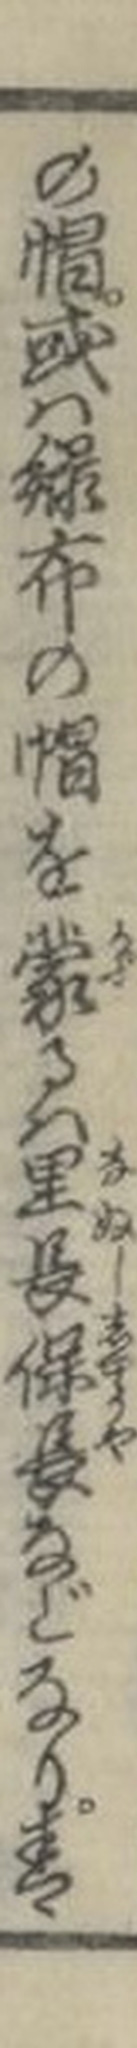の帽。或は緑布の帽を蒙るは里長保長などなり。青
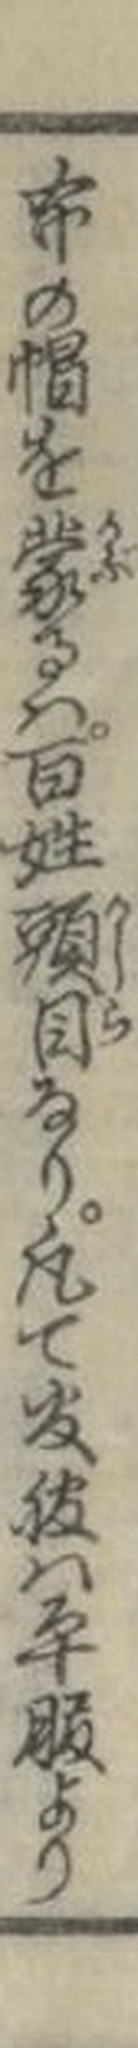布の帽を蒙るは。百姓頭目なり。凡て官服は平服より
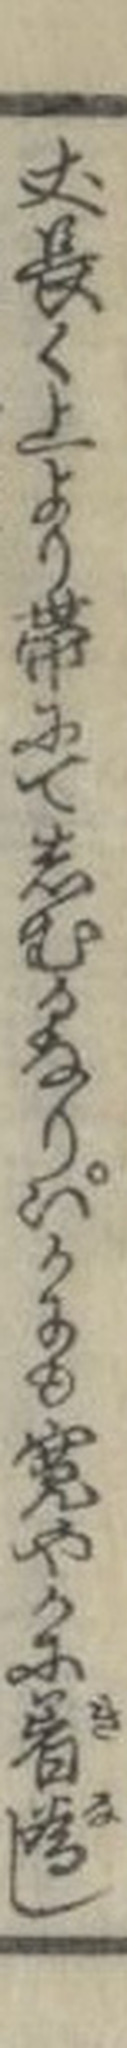丈長く上より帯にてしむるなり。いかにも寛やかに着為し
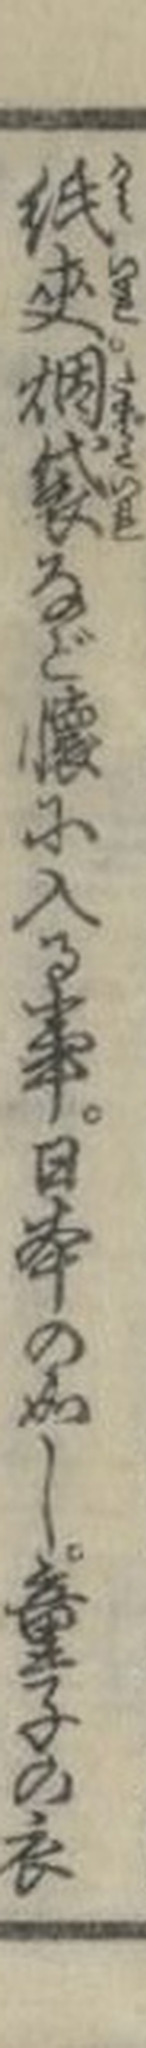紙夾烟袋など懐に入る事。日本の如し。童子の衣
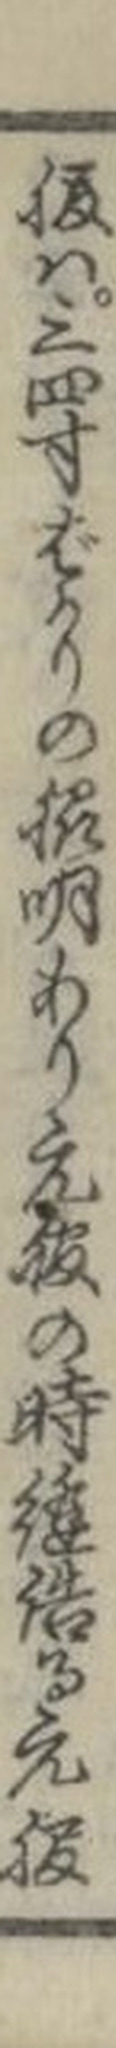服は。三四寸ばかりの明あり元服の時浩元服
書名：琉球解語
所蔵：University of the Ryukyus Library
